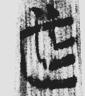必
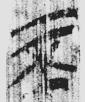不
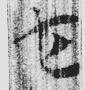才（在）
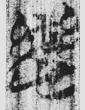○（慈）
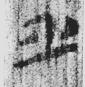之
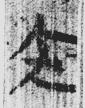內
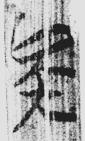矣
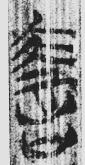○（顏）
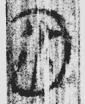囦（淵）
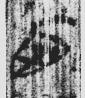西
